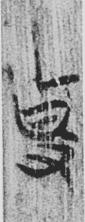○（使）
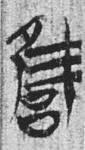○（雍）
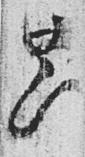也
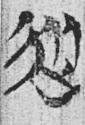從
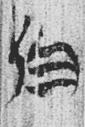於
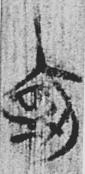○（宰）
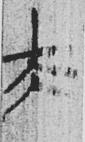夫
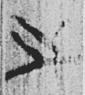之
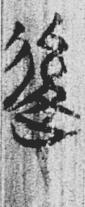○（後）
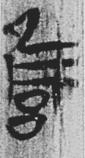○（雍）
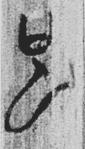也
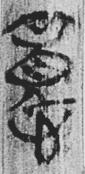憧
